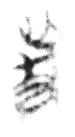贎
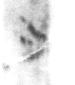之
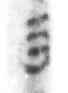司
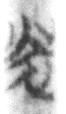褮
